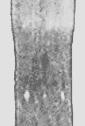八
